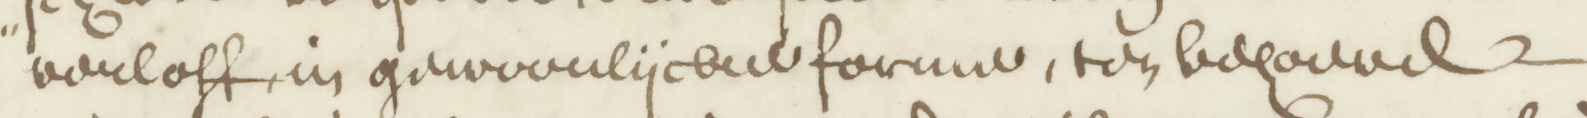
verloff, in gewoonlijcken forme, ten behoeve
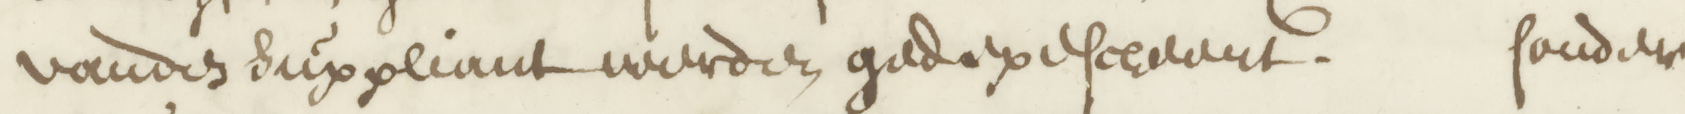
vanden Suppliant werden gedepescheert. sonder
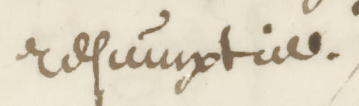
resumptie.
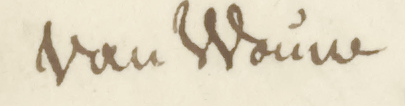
van Wouw
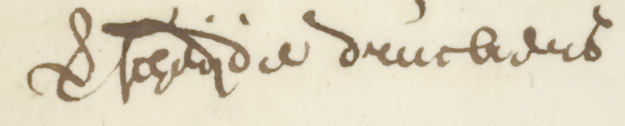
Vscheijde druckers
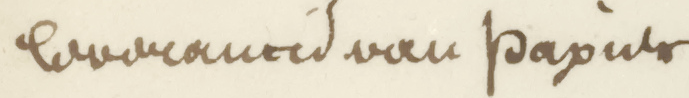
leverancie van Papier
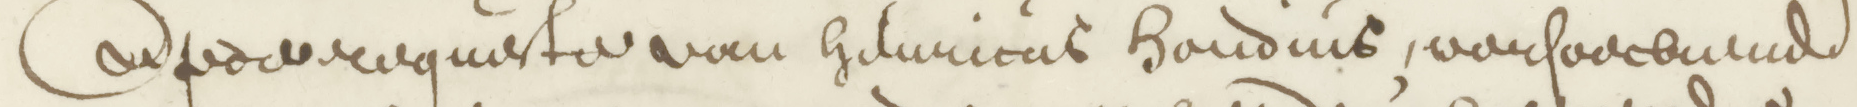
Opde requeste van henricus hondius, versoeckende
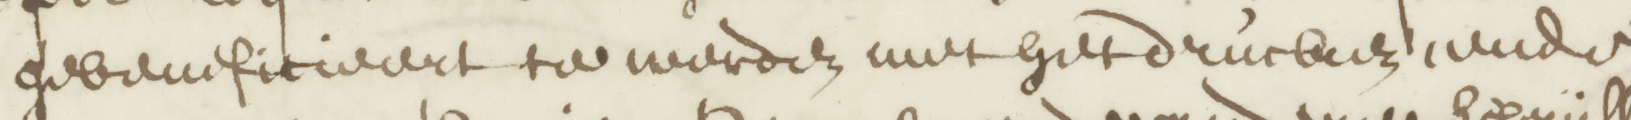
gebeneficieert te werden met het drucken, ende
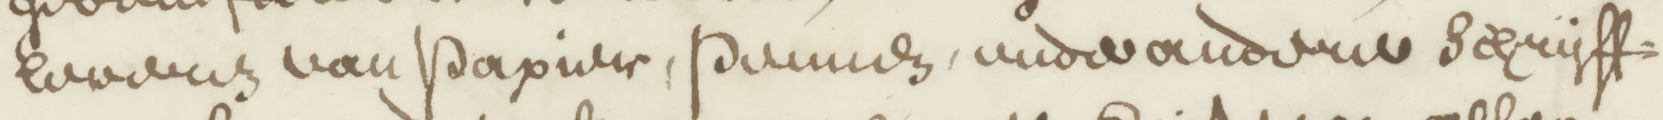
leveren van Papier, Pennen, ende andere schrijff=
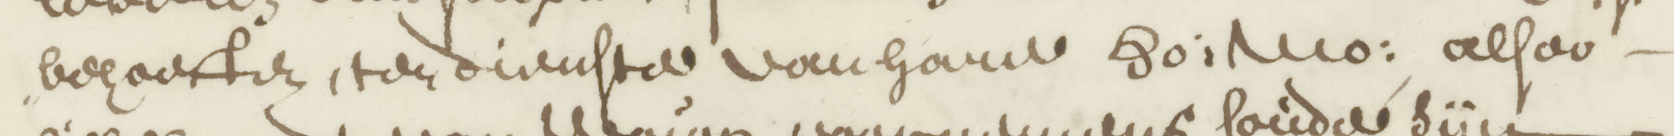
„behoeften, ten dienste van hare ho:mo: alsoo -
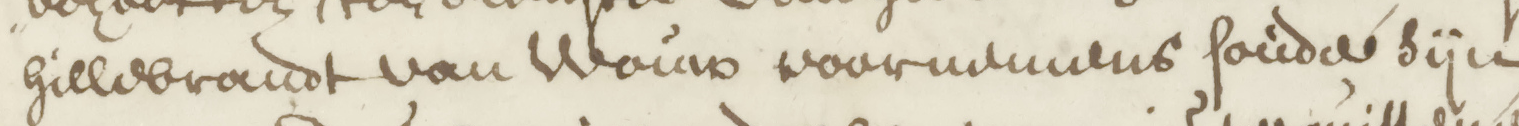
hillebrandt van Wouw voornemens soude sijn
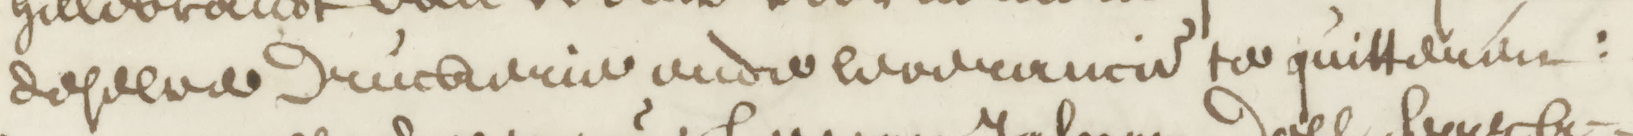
deselve Druckerie ende leveancie te quitteren:
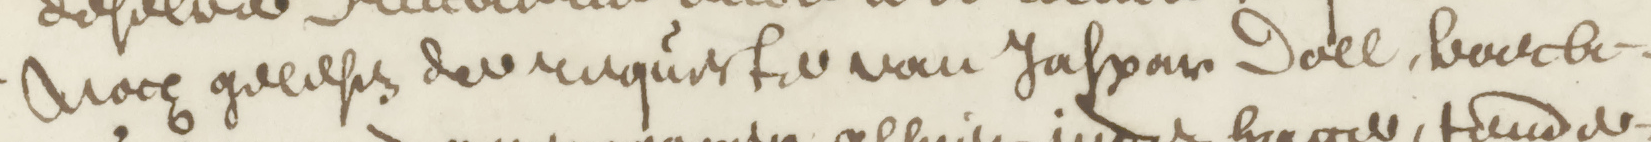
Noch gelesen de requeste van Jaspar Doll, boeck„
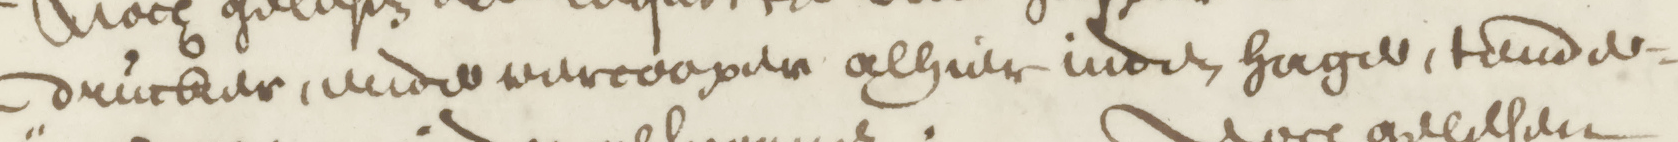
„drucker, ende vercooper alhier inden hage, tende=
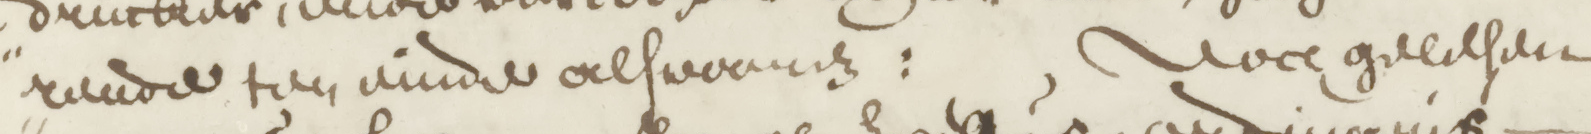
,,rende ten einde alsvooren: Noch gelesen
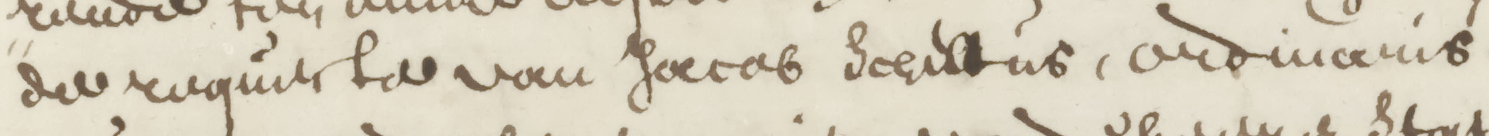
de requeste van Jacob Scheltus, ordinaris
